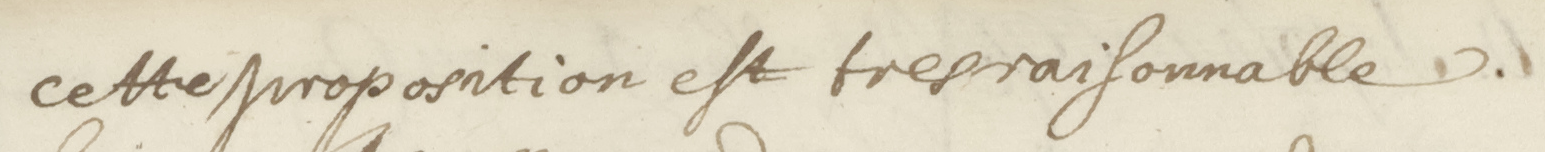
cette proposition est tres raisonnable.
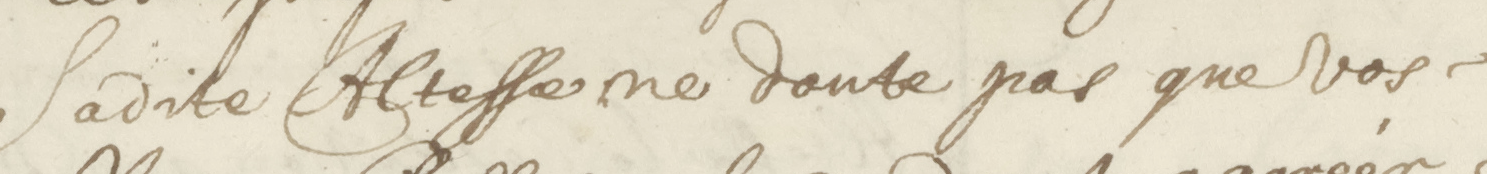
Sadite Altesse ne doute pas que vos
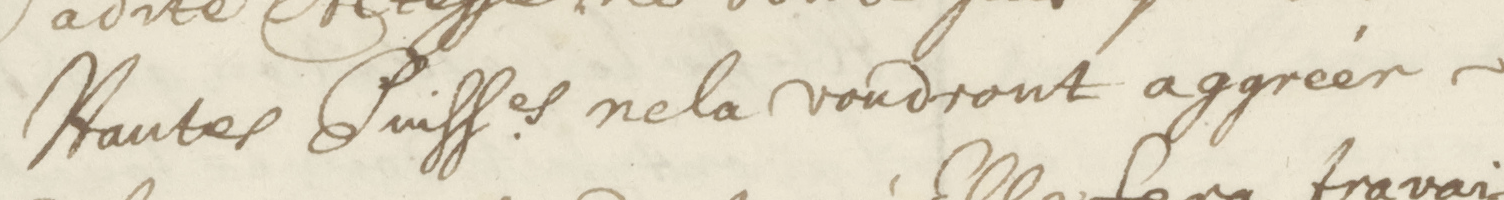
Hautes Puisses nela voudront aggreér
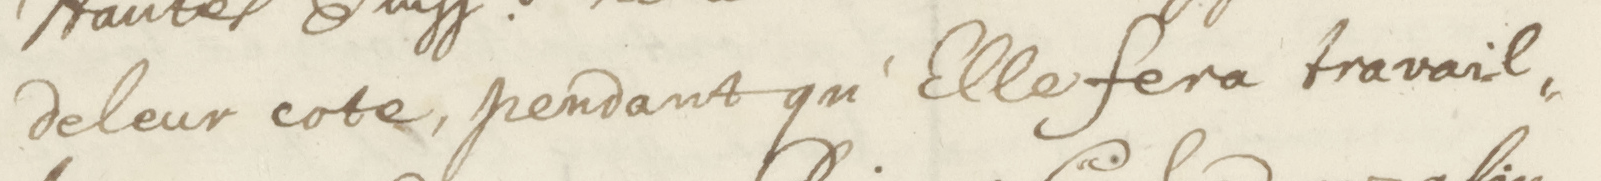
deleur cote, pendant qu'Elle fera travail,,
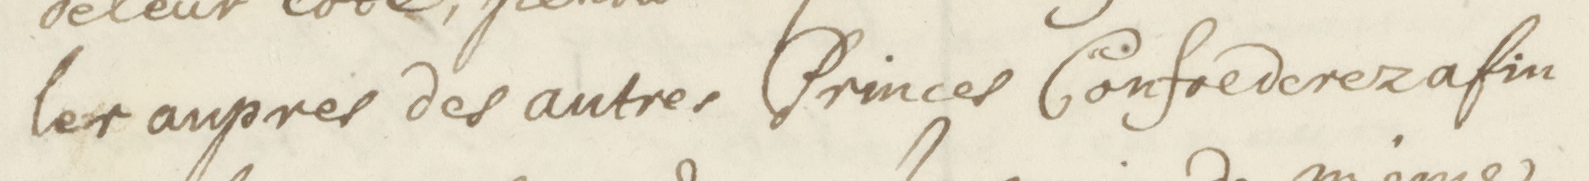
ler aupres des autres Princes Confoederez a fin
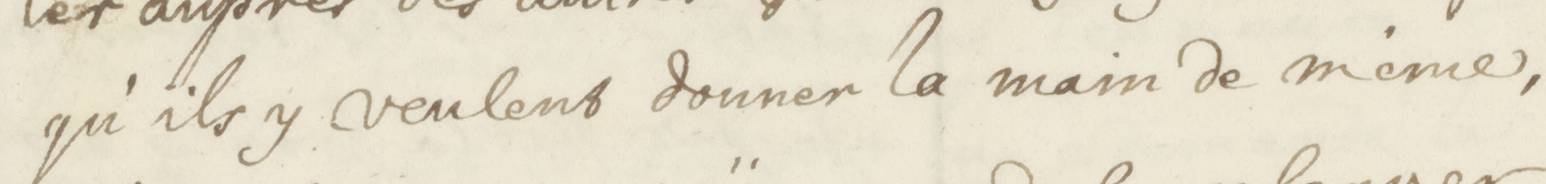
qu'ils y veulent donner la man de meme
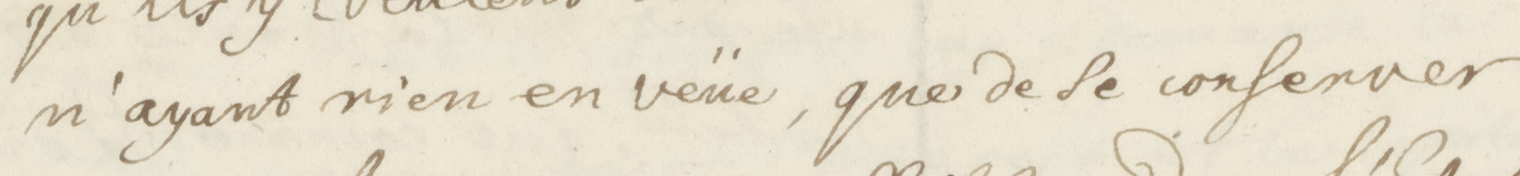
n'ayant rien en veüe, que de se conserver
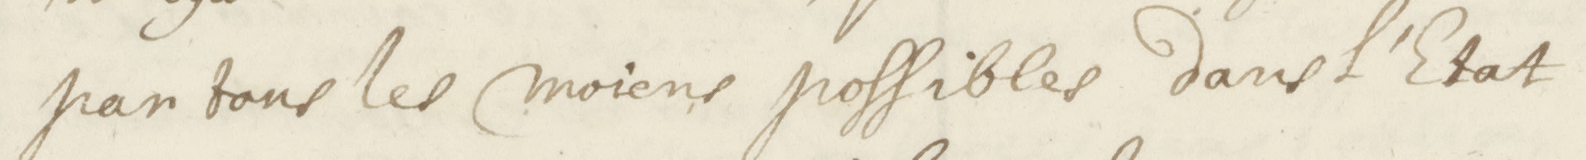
par tous les moiens possibles dans L'Etat
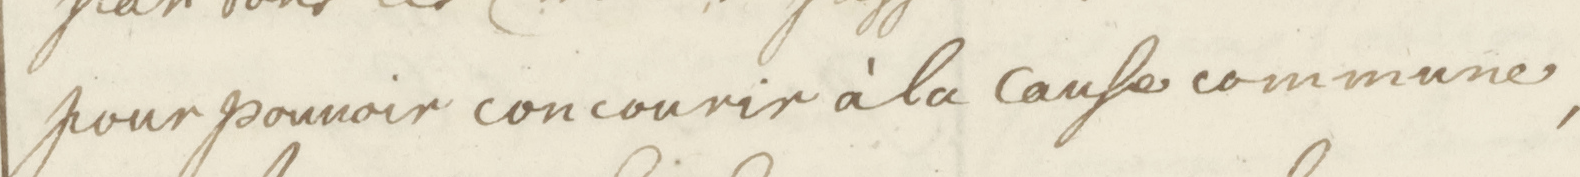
pour pouvoir concourir a'la cause commune
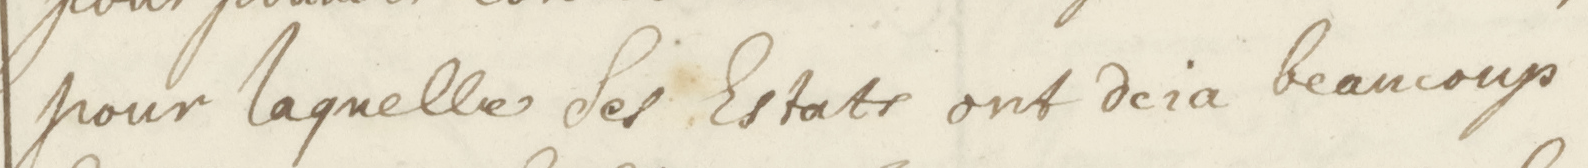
pour laquelle ses Estats ont deia beaucoup
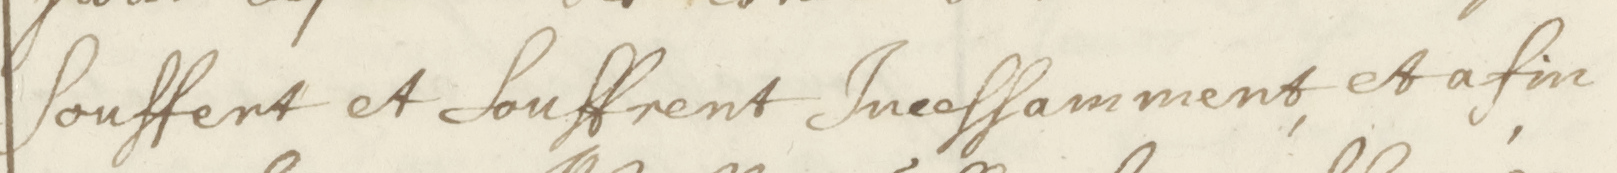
souffert et souffrent Incessamment, et afin
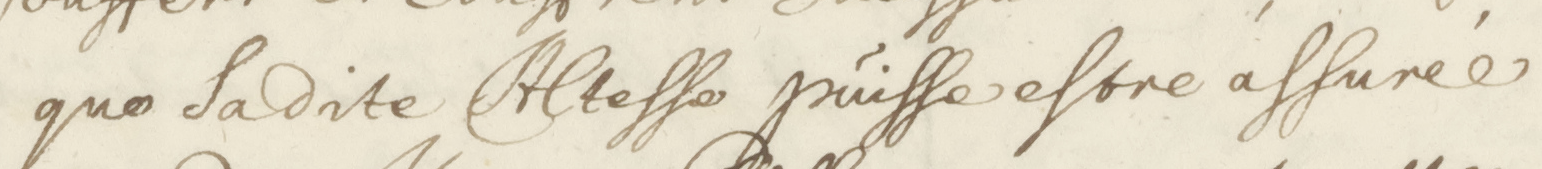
que Sadite Altesse puisse estre assurée
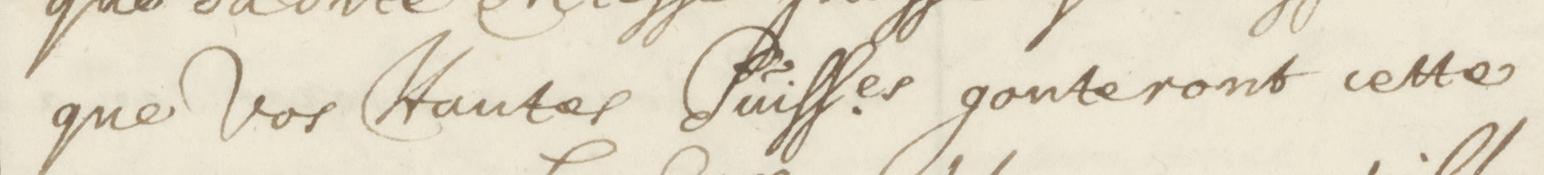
que Vos Hautes Puisses. gouteront cette
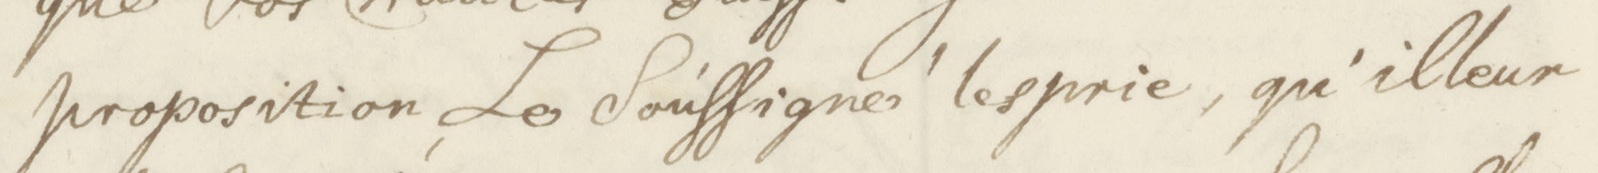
proposition Le Soussigné lesprie, qu'il leur
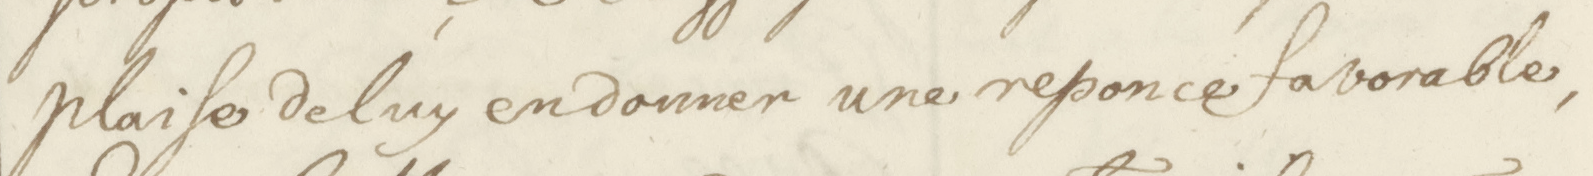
plaise de luy en donner une reponce favorable,
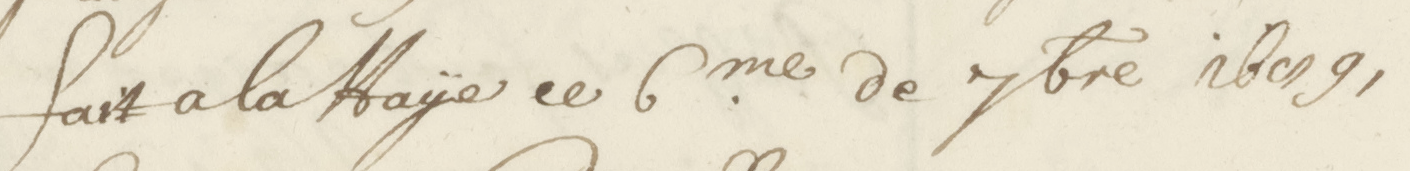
fait a la Haije ce 6.me de 7bre 1689.
